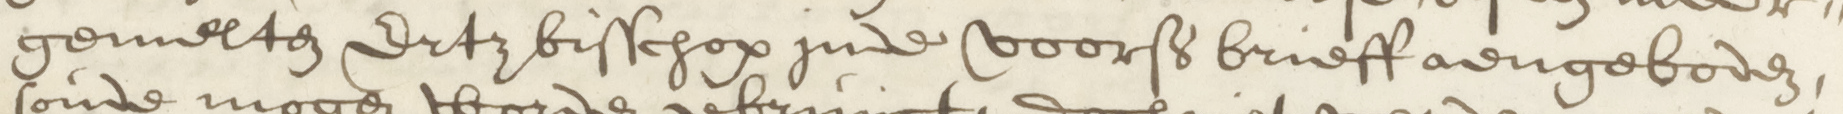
gemelten Ertzbisschop in de voorsz. brieff aengeboden
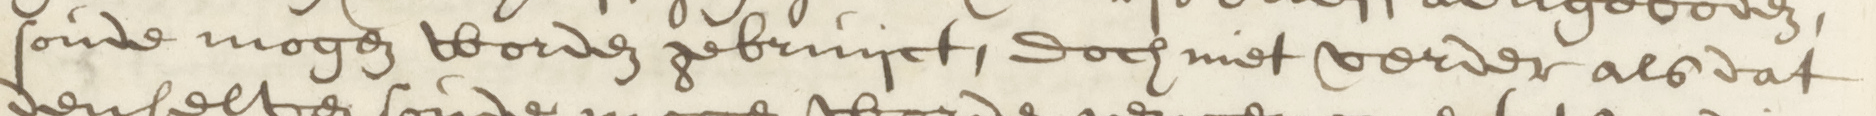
soude mogen worden gebruijct, doch niet verder als dat
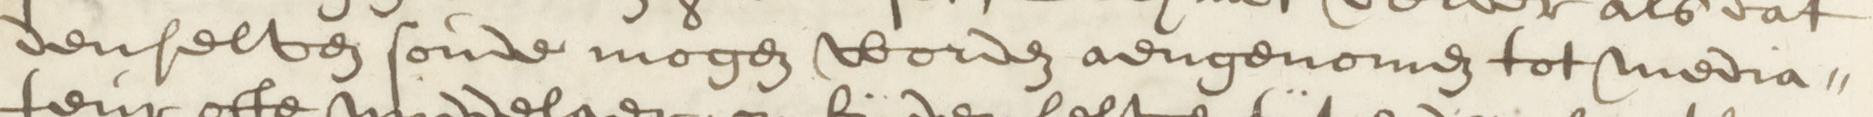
denselven soude mogen worden aengenomen tot media„
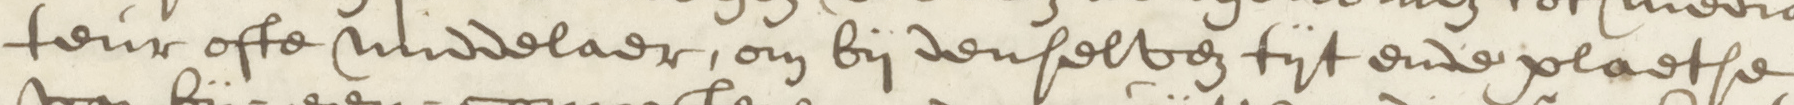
teur ofte middelaer, om bij denselven tijt ende plaetse
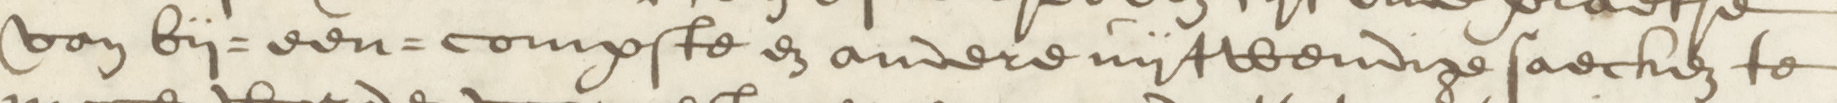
van bij‒een‒compste en andere uijtwendige saecken te
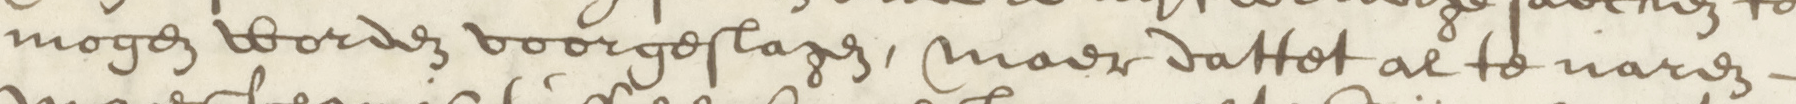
mogen worden voorgeslagen, maer dattet al te naren —
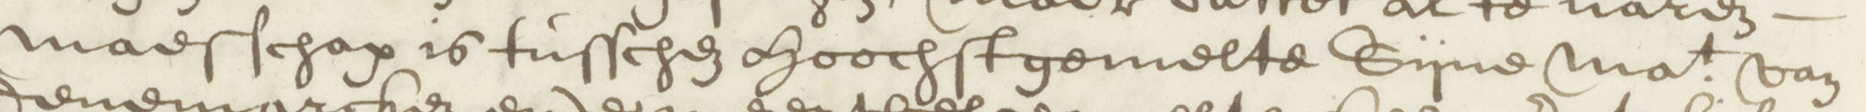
maesschap is tusschen Hoochstgemelte Sijne Mat. van
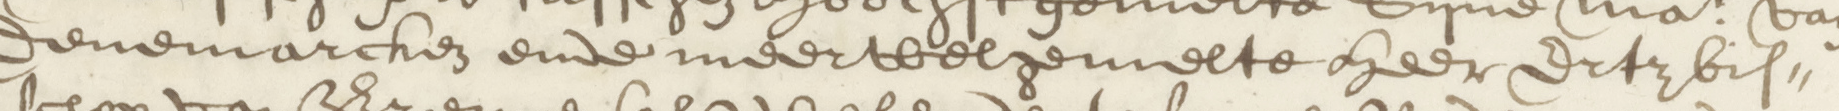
Denemarcken ende meerwelgemelte Heer Ertzbis„
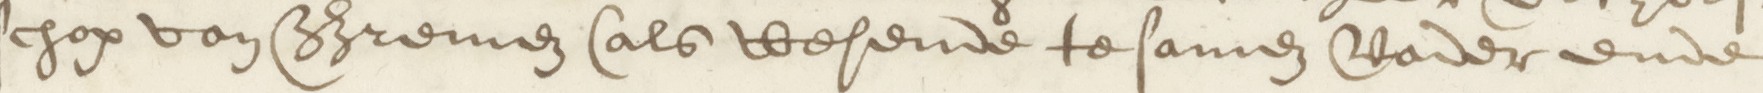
schop van Bremen (als wesende tesamen vader ende
